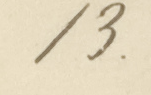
13.
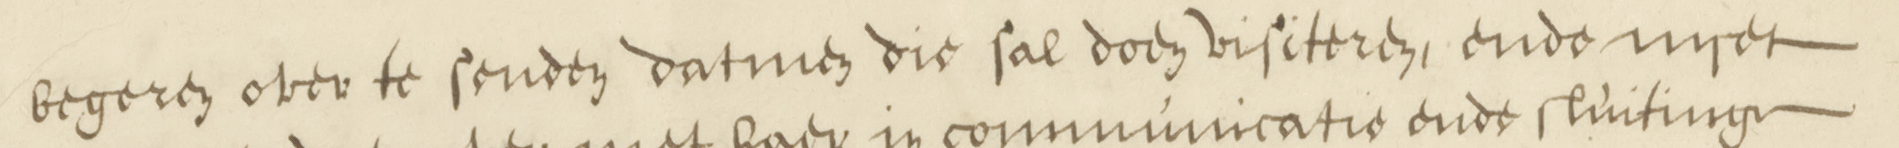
begeren over te senden dat men die sal doen visiteren, ende nyet
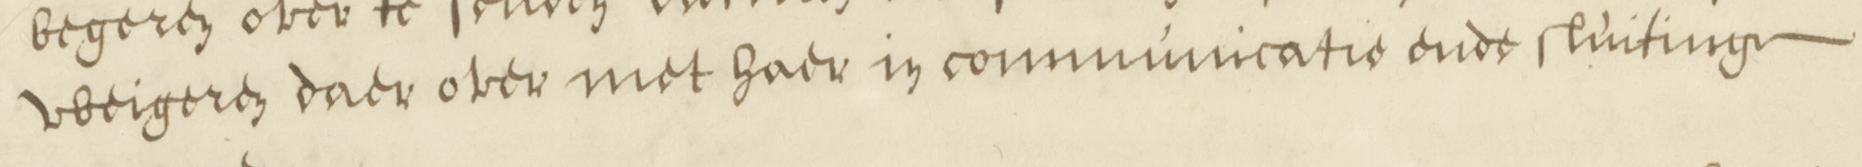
weigeren daer over met haer in communicatie ende sluitinge
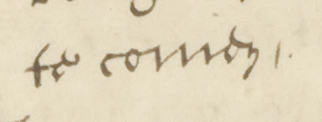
te comen.
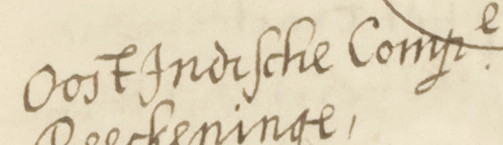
OostIndische Compe.
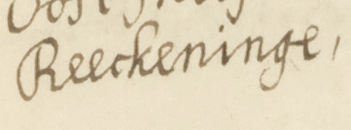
Reeckeninge.
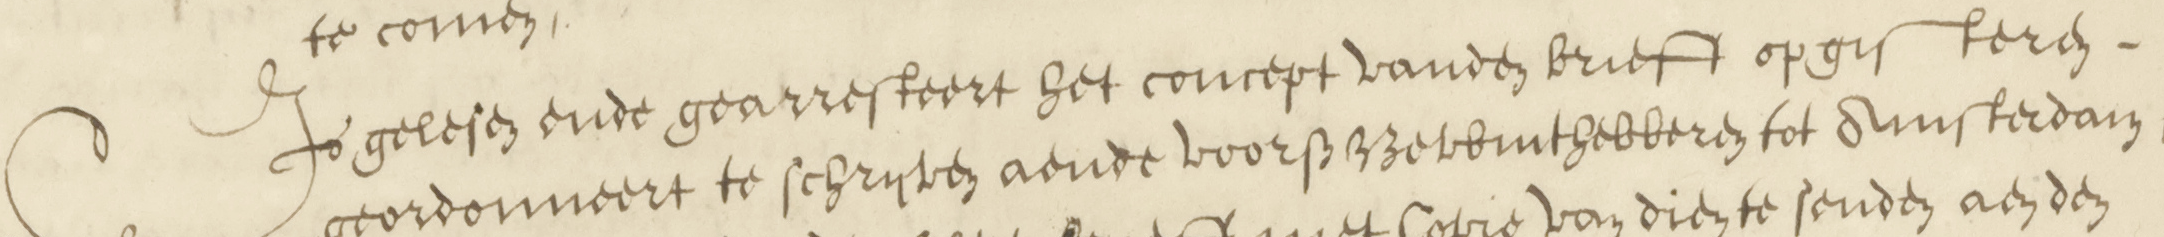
Is gelesen ende gearresteert het concept vanden brieff op gisteren -
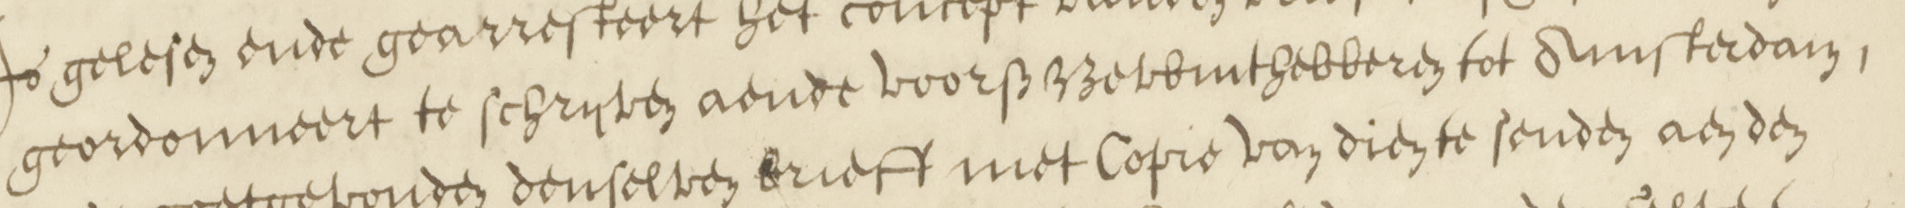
geordonneert te schryven aen den voors Bewinthebberen tot Amsterdam,
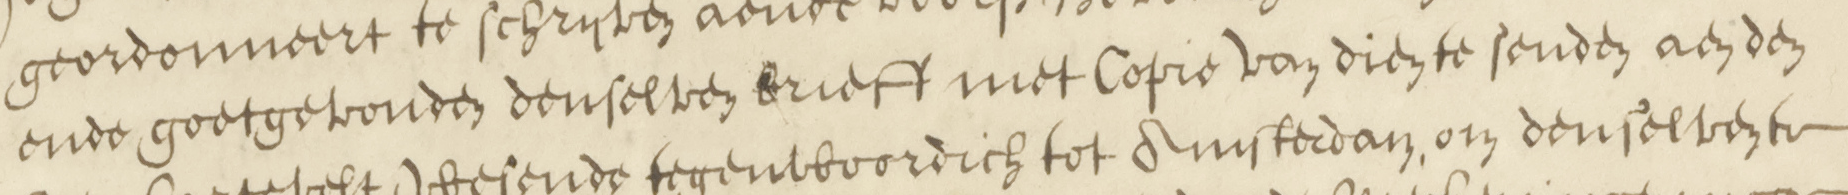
ende goetgevonden denselven brieff met Copie van dien te senden aen den
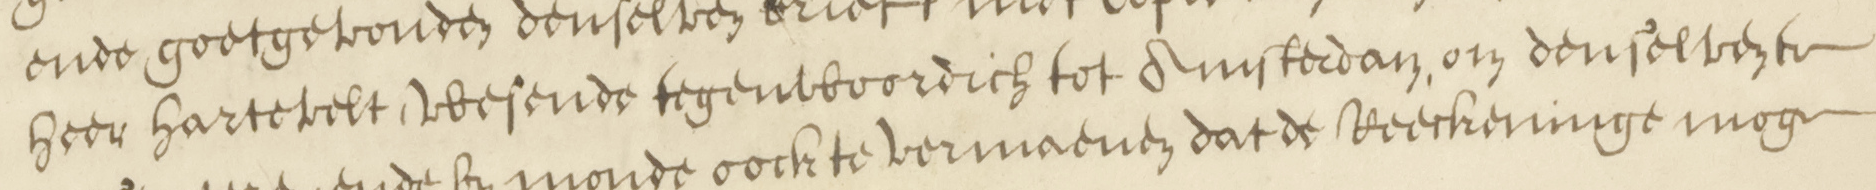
heer hartevelt, wesende tegenwoordich tot Amsterdam, om denselven te
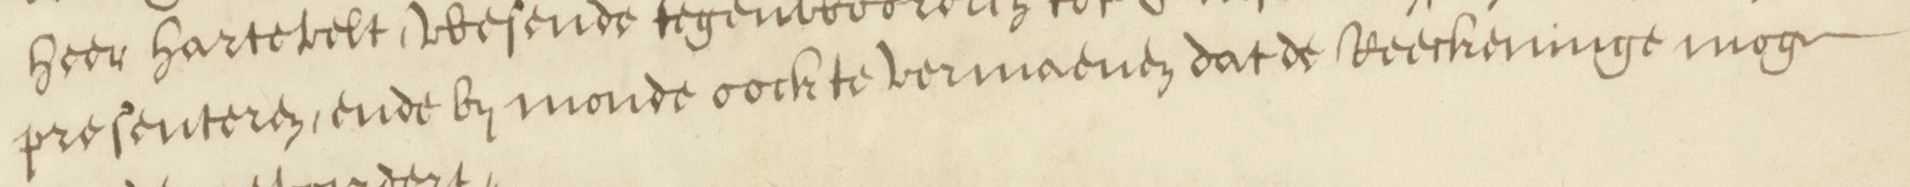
presenteren, ende by monde oock te vermaenen dat de Reeckeninge moge
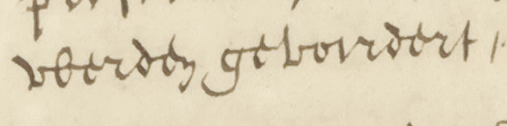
werden gevoirdert.
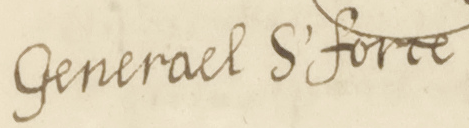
Generael S‛force
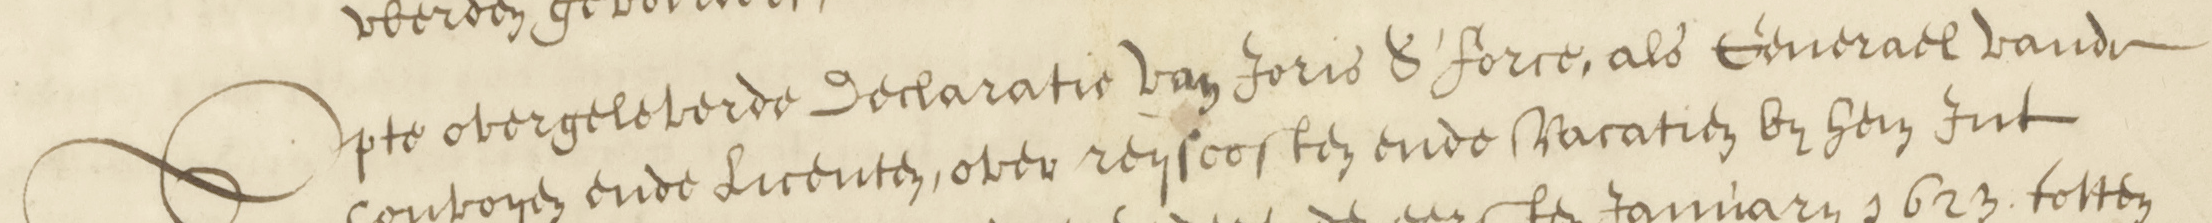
Opte overgeleverde Declaratie van Joris S‛Force, als Generael vande
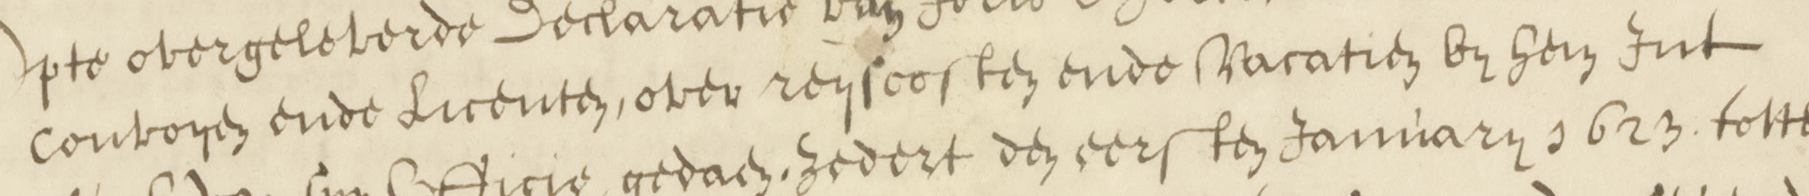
convoyen ende Licenten, over reyscosten ende Vacatien by hem Int
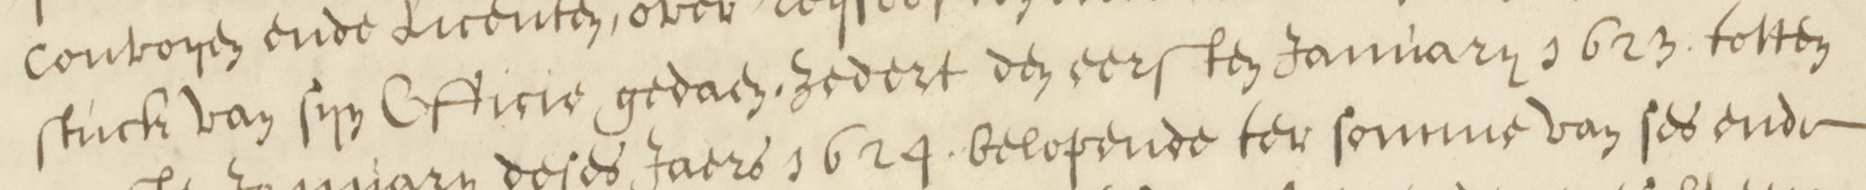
stuck van syn Officie gedaen, zedert den eersten January 1623 totten
